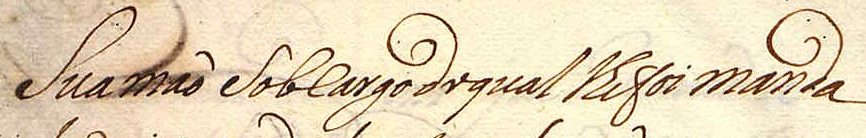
Sua maõ Sob cargo do qual lhe foi manda
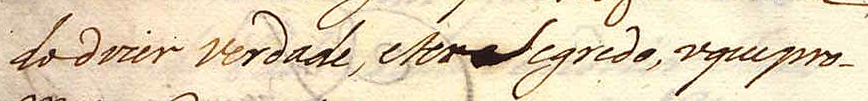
do dizer verdade, e ter Segredo, o que pro
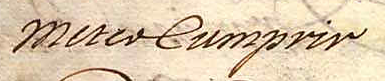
meteo cumprir
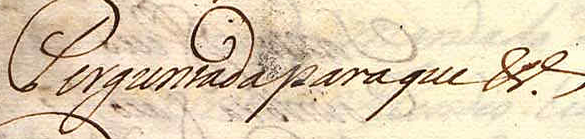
Perguntada para que &r.a
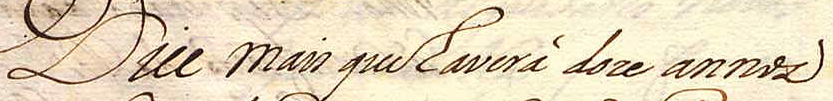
Dice mais que haverá doze annoz
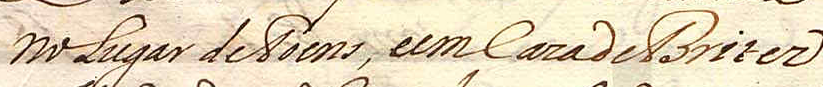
no Lugar de Toens, e em Caza de Britez
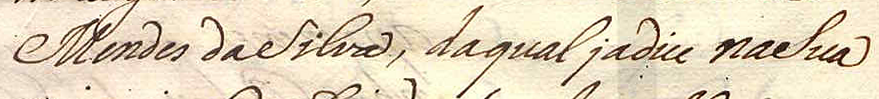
Mendes da Silva, da qual ja dice na Sua
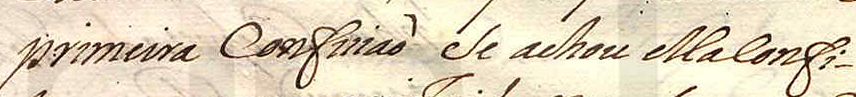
primeira confissaõ se achou ella confi
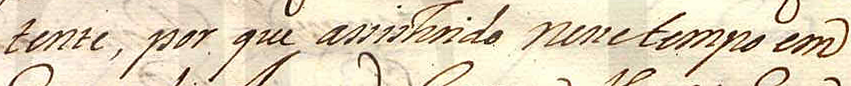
tente, por que assistindo nesse tempo em
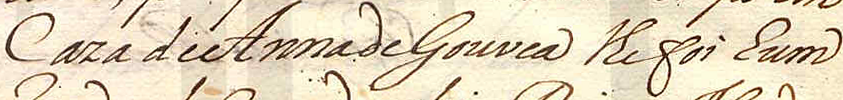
Caza de Anna de Gouvea lhe foi hum
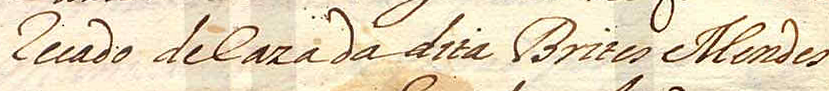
Recado de Caza da dita Brites Mendes
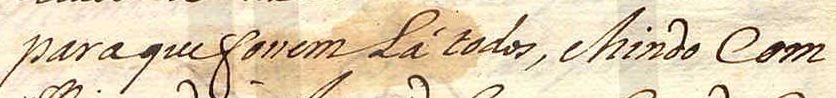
para que fossem Lá todos, e hindo com
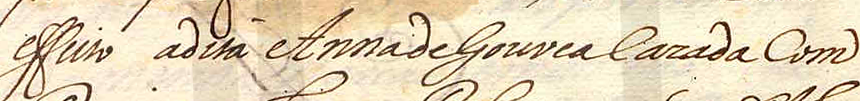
effeito a dita Anna de Gouvea Cazada Com
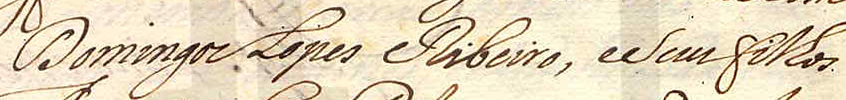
Domingos Lopes Ribeiro, e seus filhos
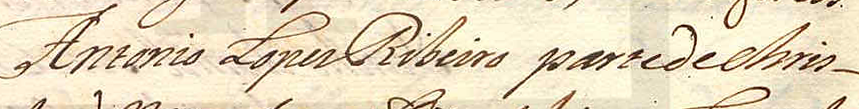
Antonio Lopes Ribeiro parte de chris
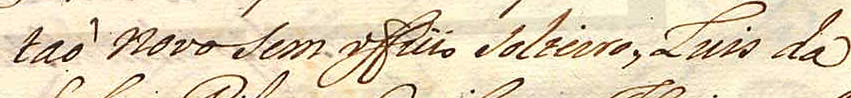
taõ novo sem officio solteiro, Luis da
